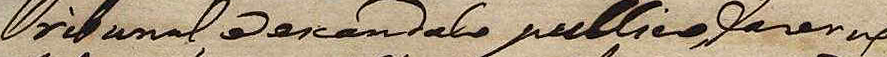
Tribunal, e escandalo publico, fazer no
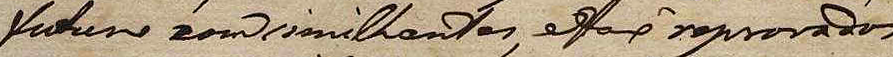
futuro com similhantes, e taõ reprovados
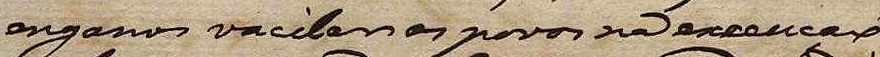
enganos vacilan os povos na execuçaõ,
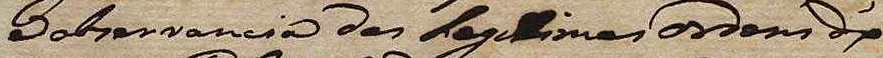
e observancia das Legi_imas ordens do
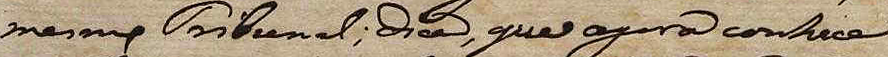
mesmo Tribunal; dice, que agora conhece
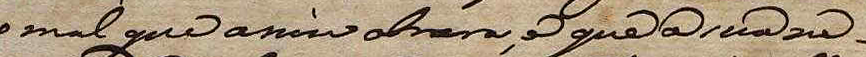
o mal que assim obrara, e que a sua ne
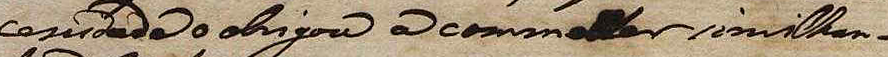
cessidade o obrigou a comme_ter similhan
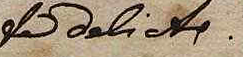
te delicto.
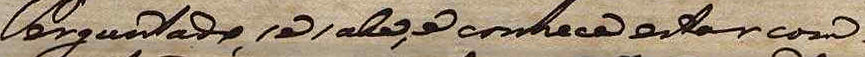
Perguntado, se sabe, e conhece estar com
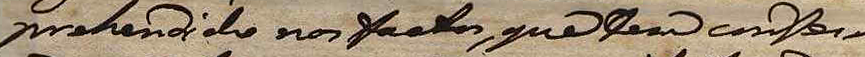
prehendido nos factos, que tem confes
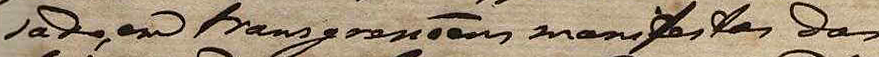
sado, em transgressõens manifestas das
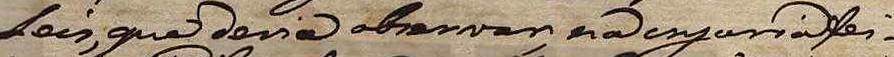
Leis, que devia observar, na enjuria fei
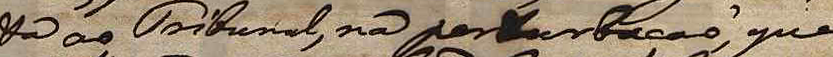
ta ao Tribunal, na perturbaçaõ, que
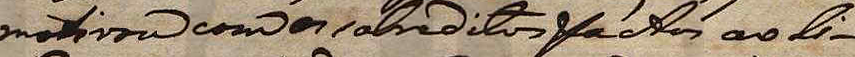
motivou com os sobreditos factos ao Li
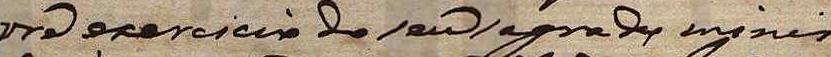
vre exercicio do seu sagrado minis
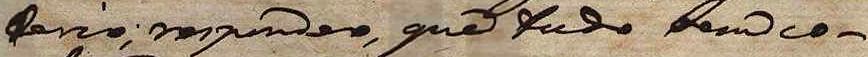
terio; respondeo, que tudo bem co
